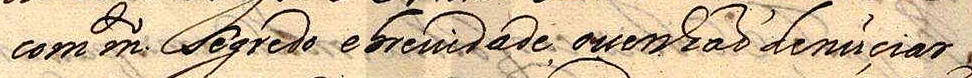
com mto segredo e breuidade o uenhaõ denūciar
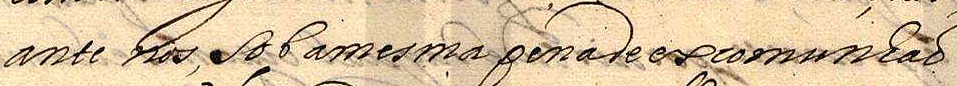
ante nos, sob a mesma pena de excomunhaõ
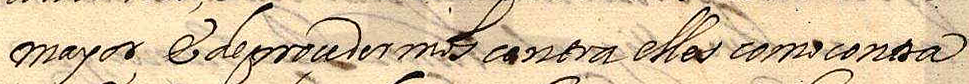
mayor, E de procedermos contra elles como contra
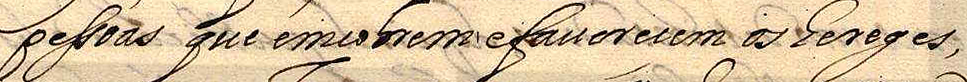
pessoas que emcobrem e fauorecem os hereges,
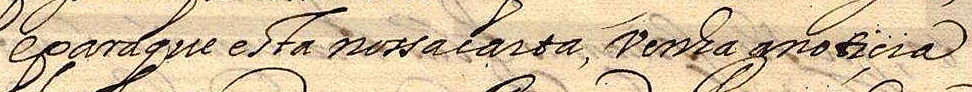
e para que esta nossa carta, venha a noticia
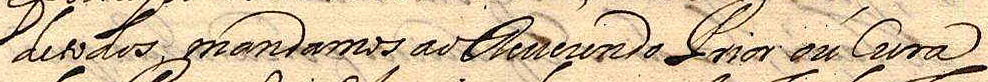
de todos, mandamos ao Reuerendo Prior ou Cura
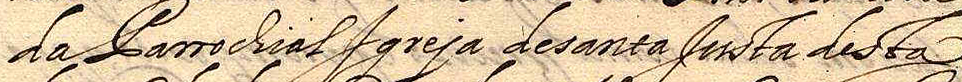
da Parrochial Jgreja de santa Justa desta
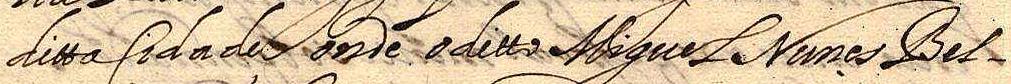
ditta Cidade onde o ditto Miguel Nunes Bel
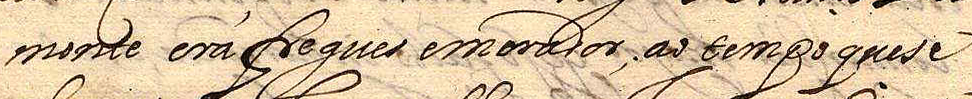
monte era fregues e morador, ao tempo que se
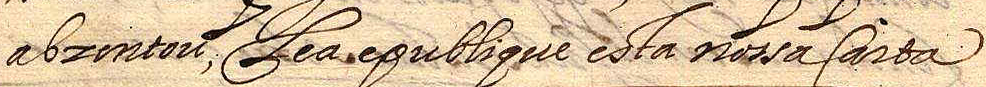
abzentou, Lea e publique esta nossa Carta
